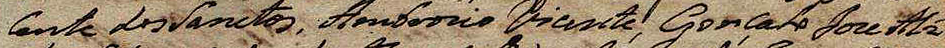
cente dos Sanctos, Ambrozio Vicente, Gonçalo Joze Alz̄
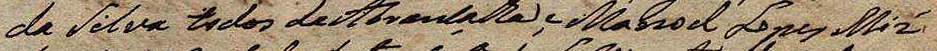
da Silva todos de Abrançalha, e Manoel Lopes Miz̄,
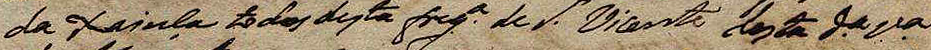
da Xainça todos desta freg.a de S. Vicente desta d.a v.a
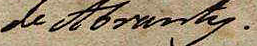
de Abrantes.
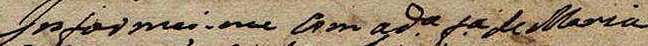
Jnformei-me com a d.a f.a de Maria
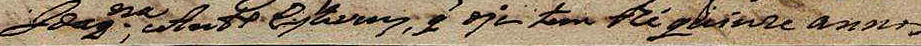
Joaq.na, e Anto Estevens, q̄ oje tem thé quinze annos
